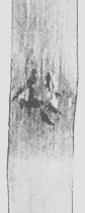八十=
